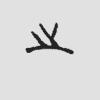出
